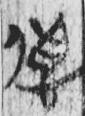德
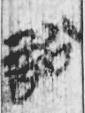訟
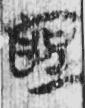聖
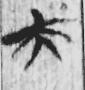夫
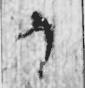人
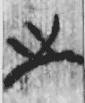之
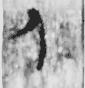人
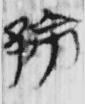○（宗）
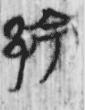○（宗）
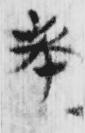未
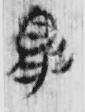{胃刀}（謂）
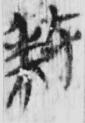殺
